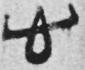心
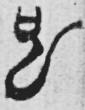也
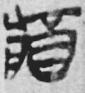𨟻（將）
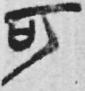可（何）
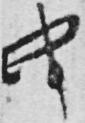女（如）
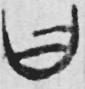曰
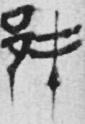邦
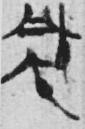風
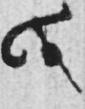氏（是）
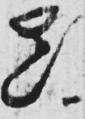也
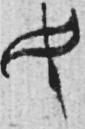民
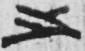之
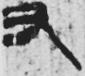又（有）
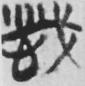慼
